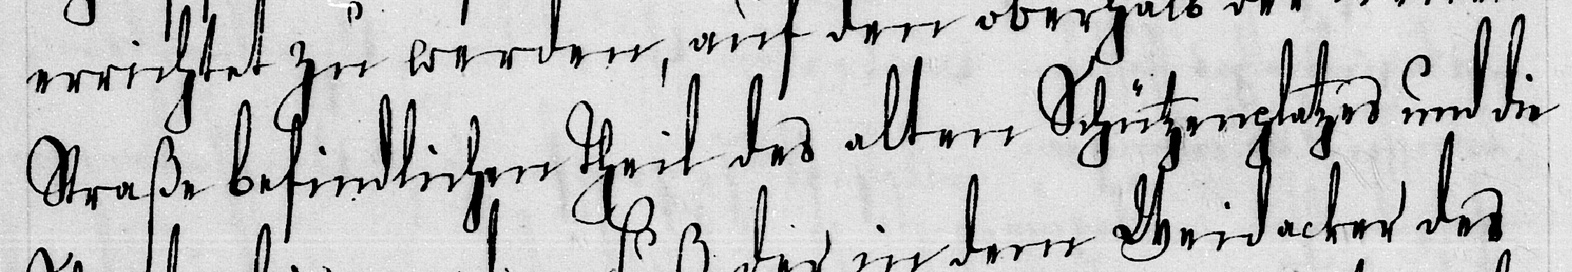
Straße befindlichen Theil des alten Schützenplatzes und
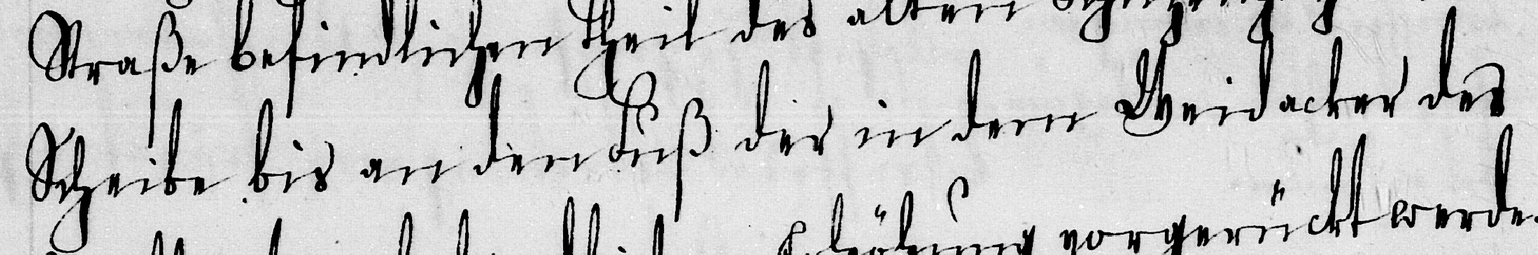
Scheibe bis an den Fuß der in dem Weidacker des
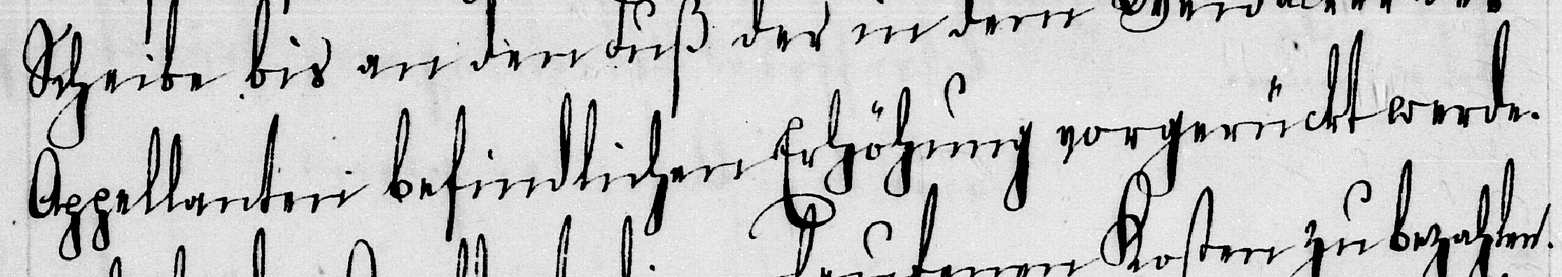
Appellanten befindlichen Erhöhung vorgerückt werde.
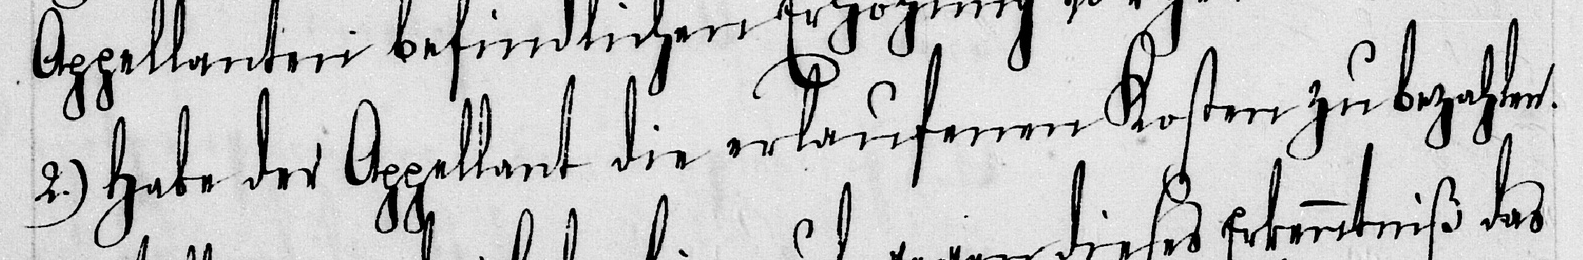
2.) Habe der Appellant die erlaufenen Kosten zu bezahlen.
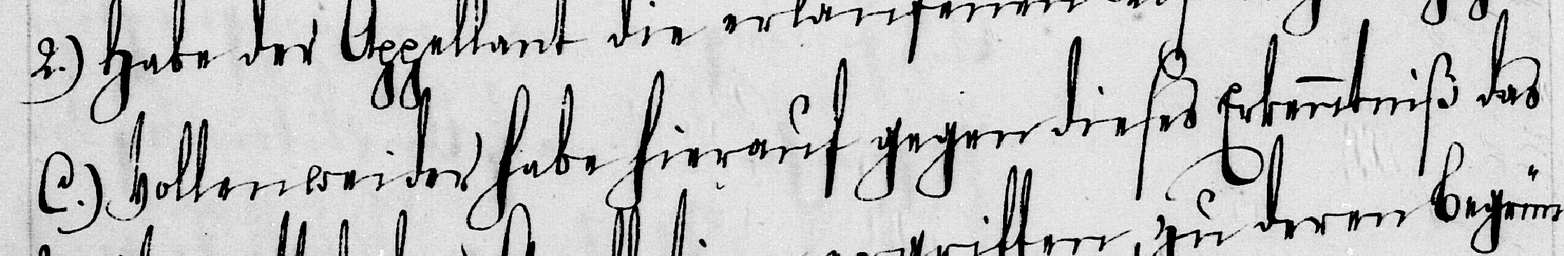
C.) Vollenweider habe hierauf gegen dieses Erkenntniß das
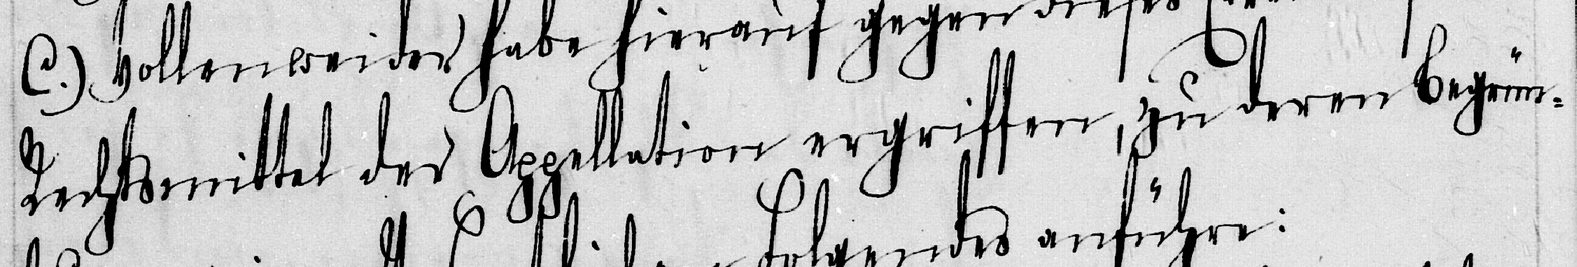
Rechtsmittel der Appellation ergriffen, zu deren Begrün¬
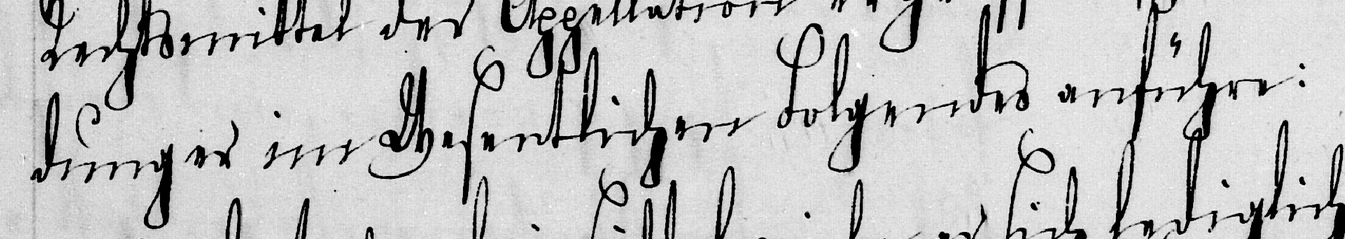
dung er im Wesentlichen Folgendes anführe:
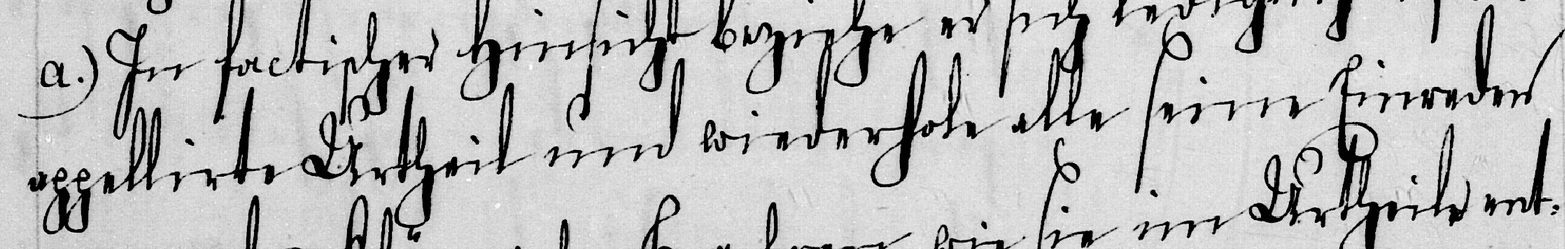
ppellirte Urtheil und wiederhole alle seine Einreden
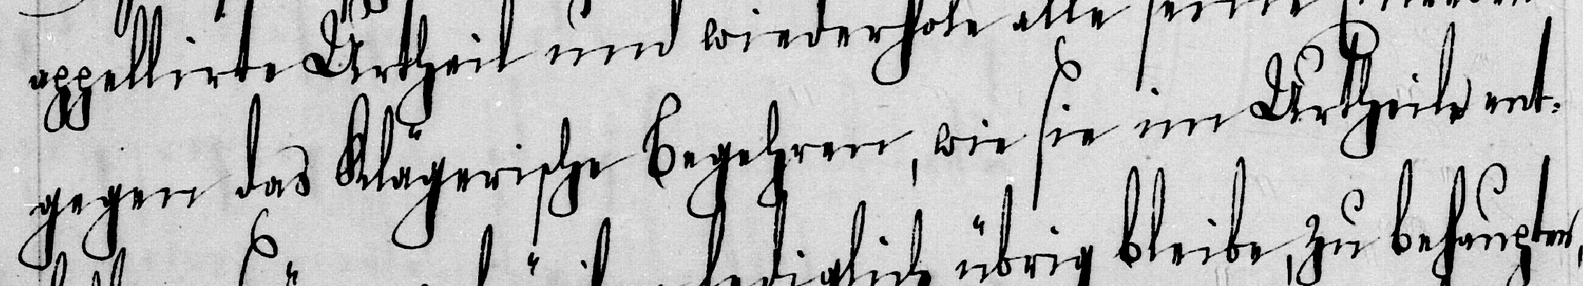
gegen das Klägerische Begehren, wie sie im Urtheile ent¬
